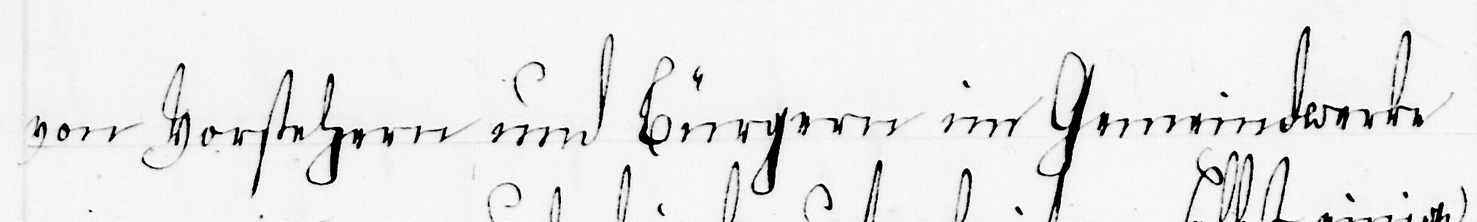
von Vorstehern und Bürgern im Gemeindwerke
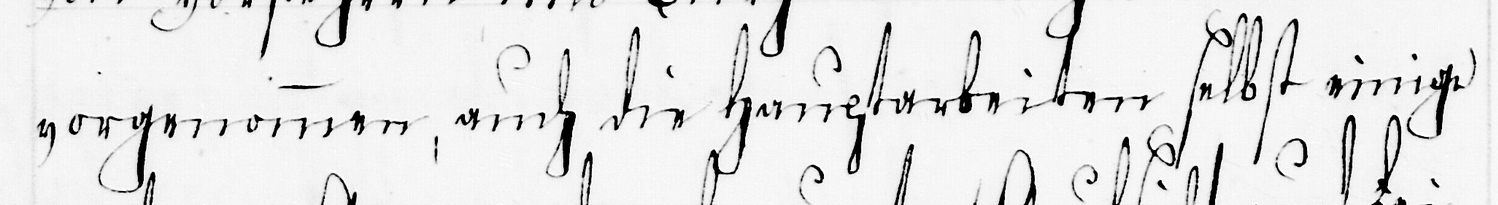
vorgenommen, auch die Hauptarbeiten selbst einige
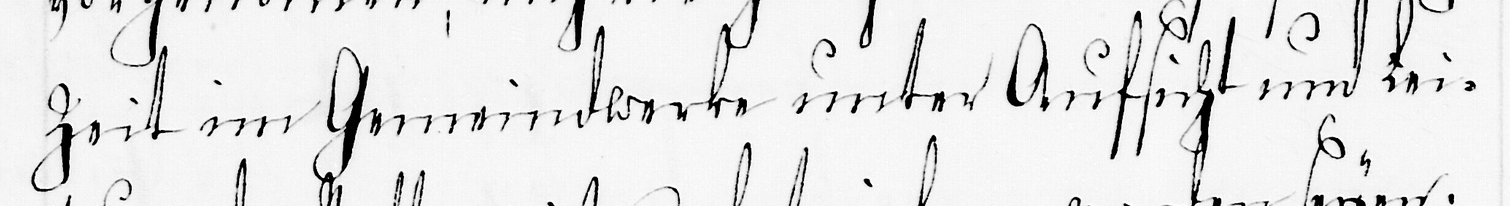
Zeit im Gemeindwerke unter Aufsicht und Lei¬
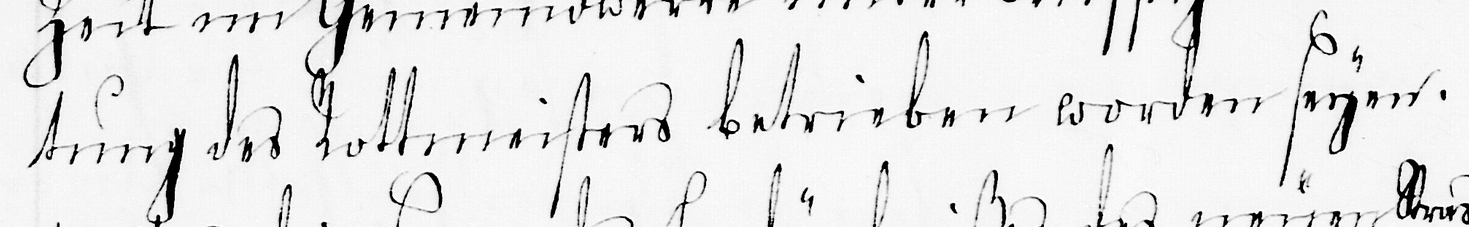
tung des Rottmeisters betrieben worden seyen.
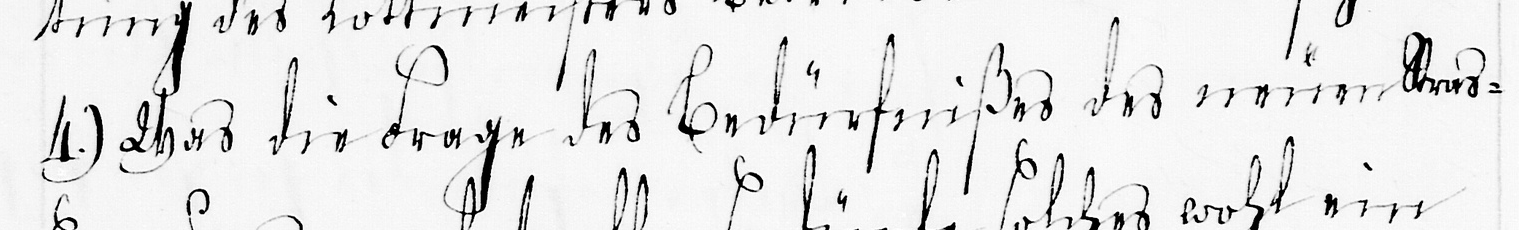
4.) Was die Frage des Bedürfnißes des neuen Stra¬
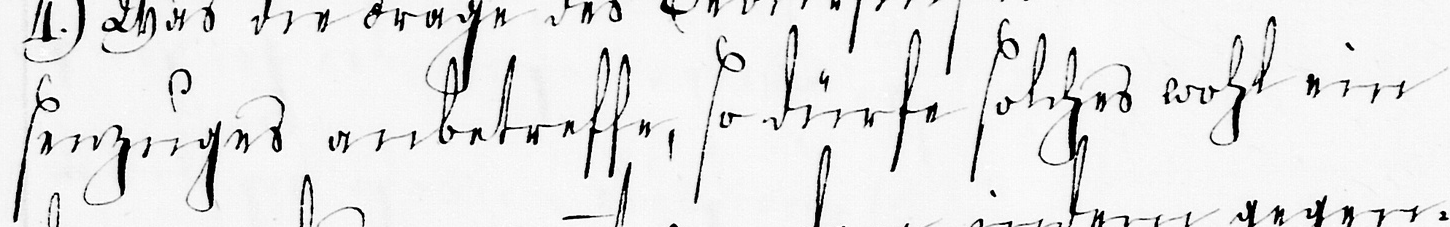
ßenzuges anbetreffe, so dürfe solches wohl ein
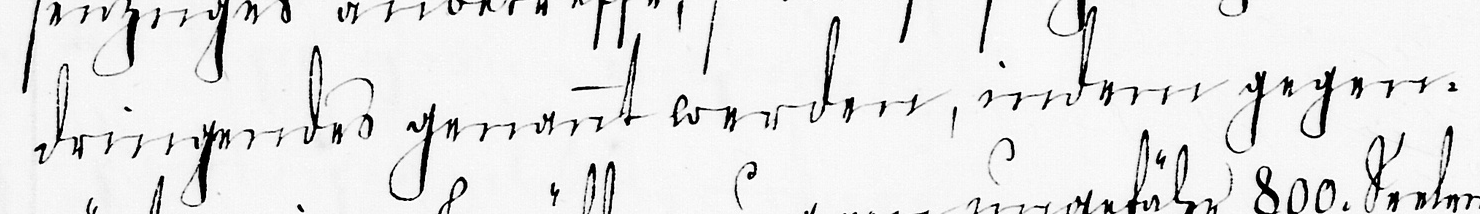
dringendes genannt werden, indem gegen¬
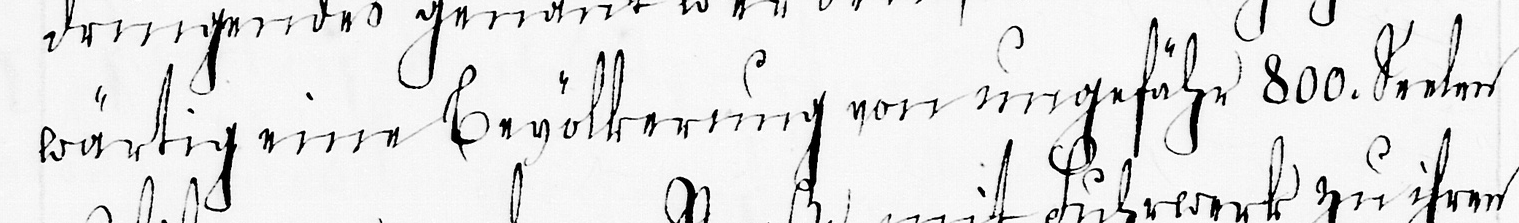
wärtig eine Bevölkerung von ungefähr 800. Seelen
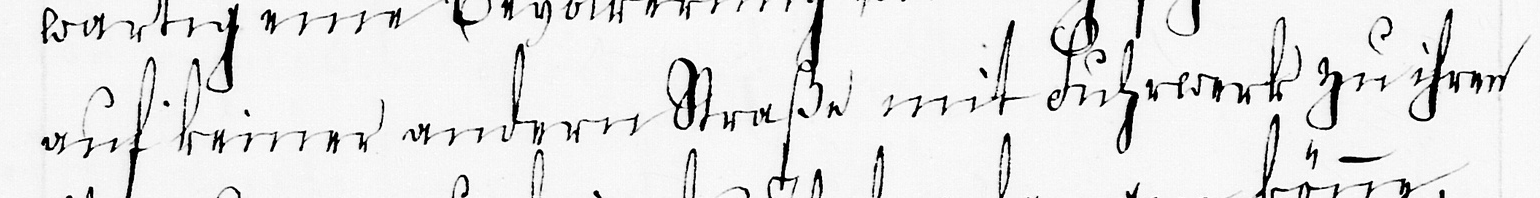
auf keiner andern Straße mit Fuhrwerk zu ihren
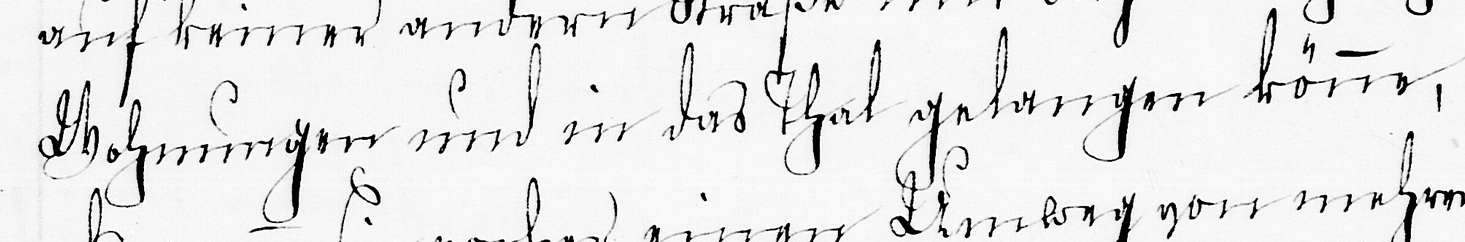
Wohnungen und in das Thal gelangen könne,
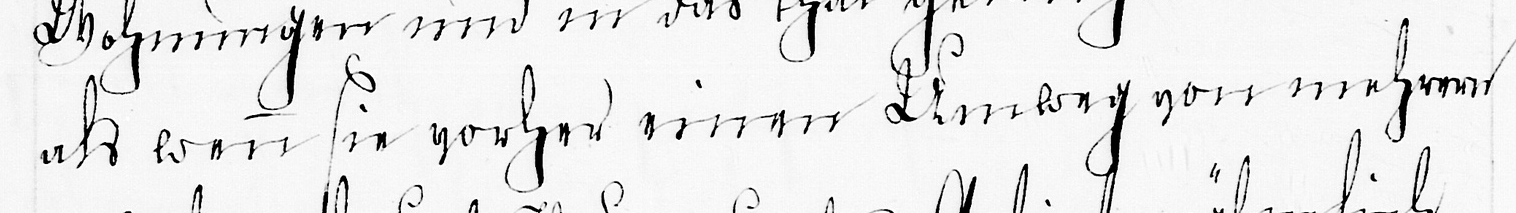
als wenn sie vorher einen Umweg von mehrern
